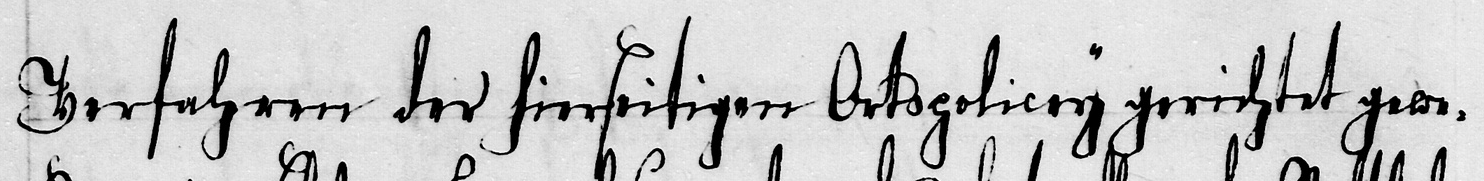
Verfahren der hierseitigen Ortspolicey gerichtet gewe¬
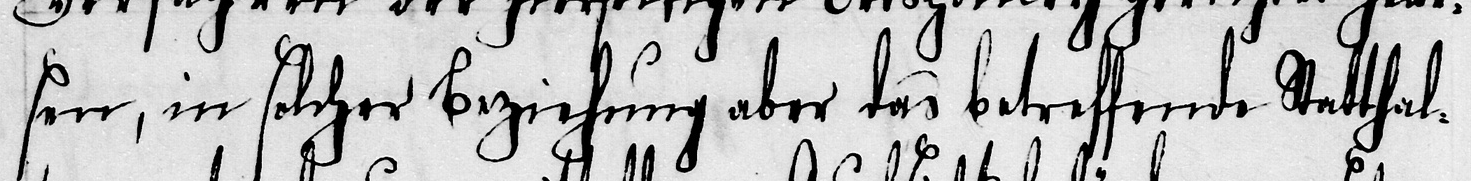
sen, in solcher Beziehung aber das betreffende Stattha¬
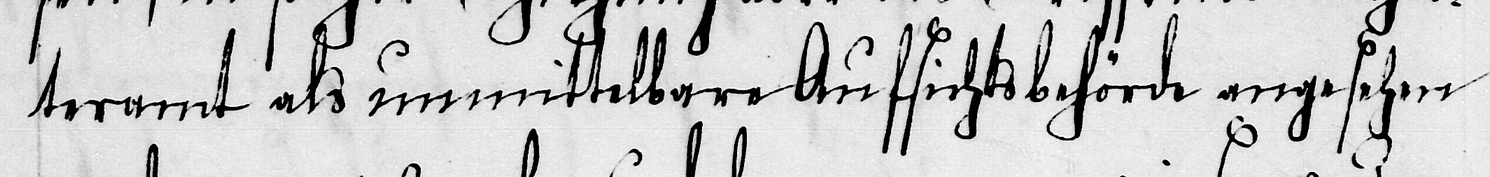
lteramt als unmittelbare Aufsichtsbehörde angesehen
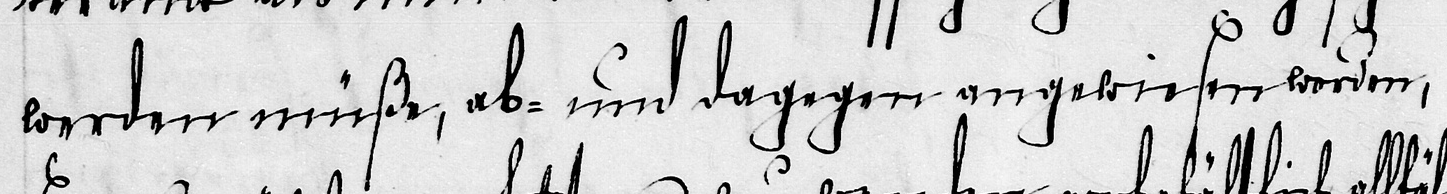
werden müße, ab- und dagegen angewiesen worden,
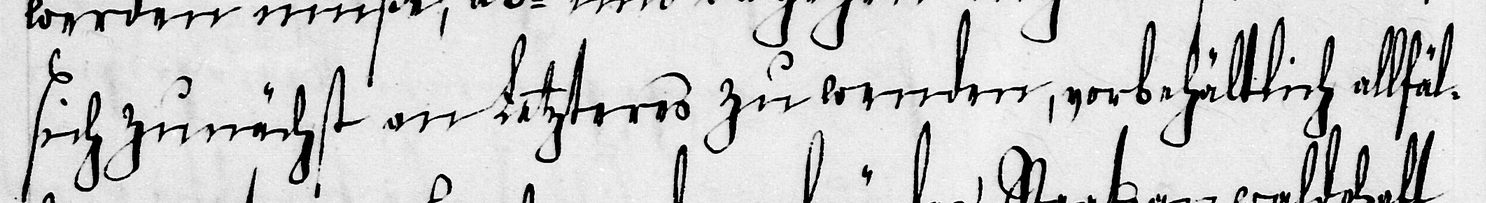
sich zunächst an Letzteres zu wenden, vorbehältlich allf¬
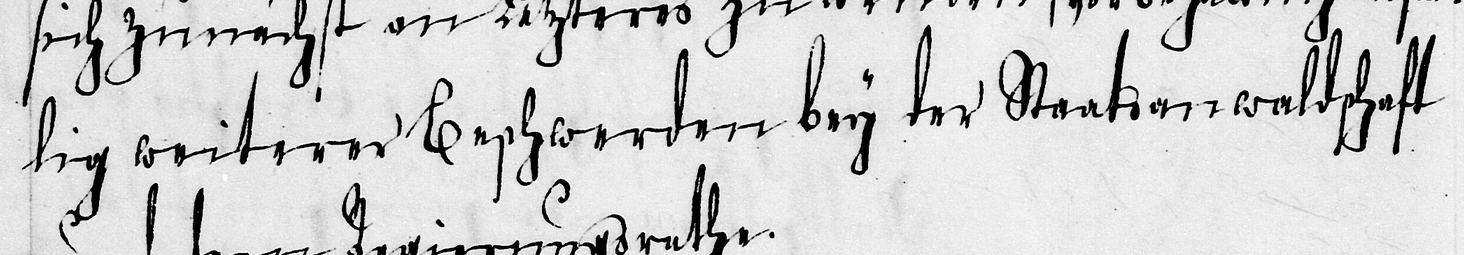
lig weiterer Beschwerden bey der Staatsanwaldschaft
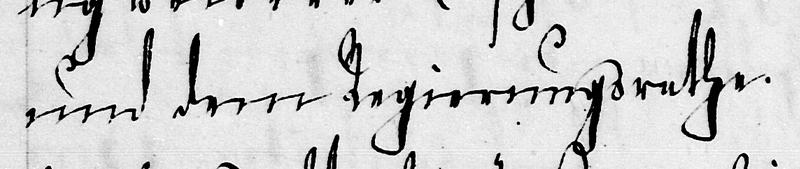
und dem Regierungsrathe.
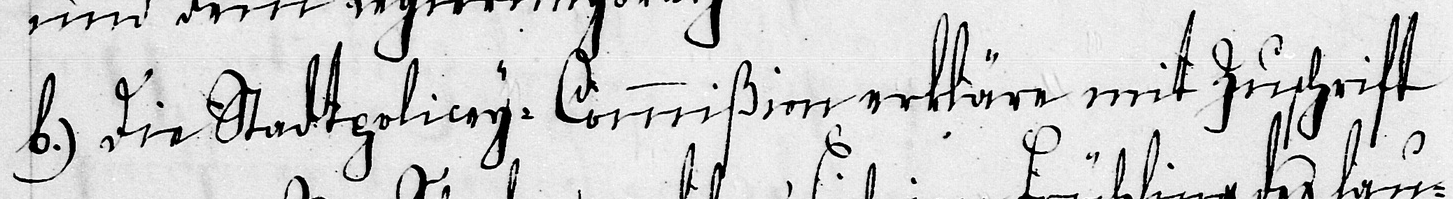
b.) Die Stadtpolicey-Commißion erkläre mit Zuschrift
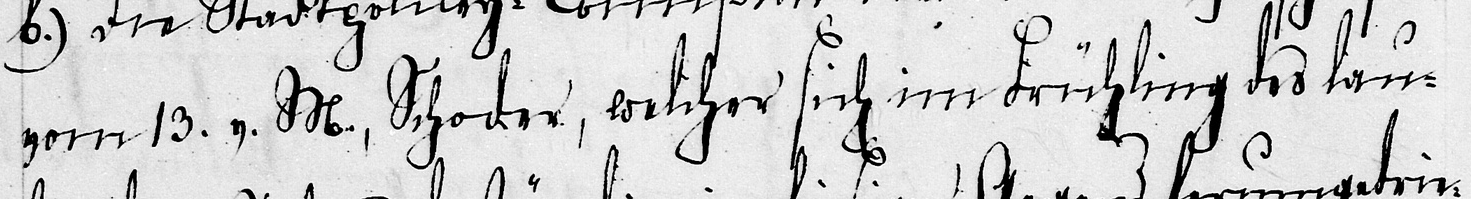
vom 13. v. M., Schoder, welcher sich im Frühling des lau¬
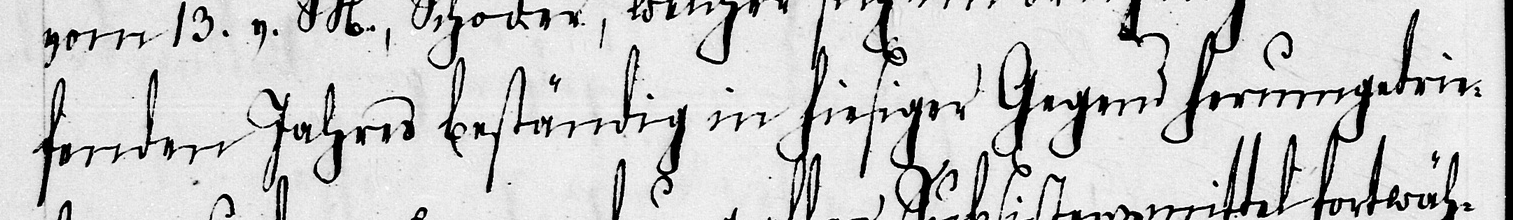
fenden Jahres beständig in hiesiger Gegend herumgetrie¬
